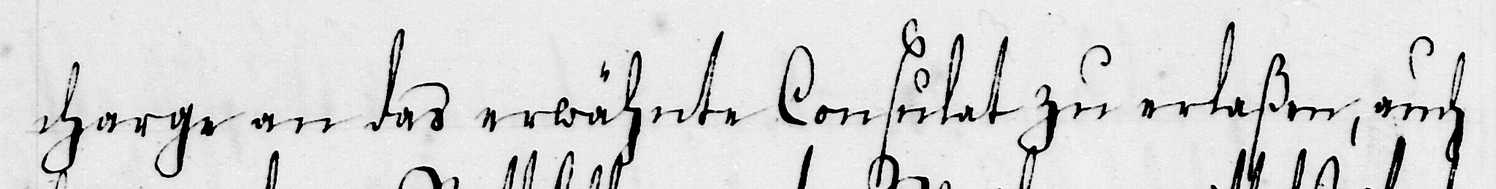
charge an das erwähnte Consulat zu erlaßen, auch
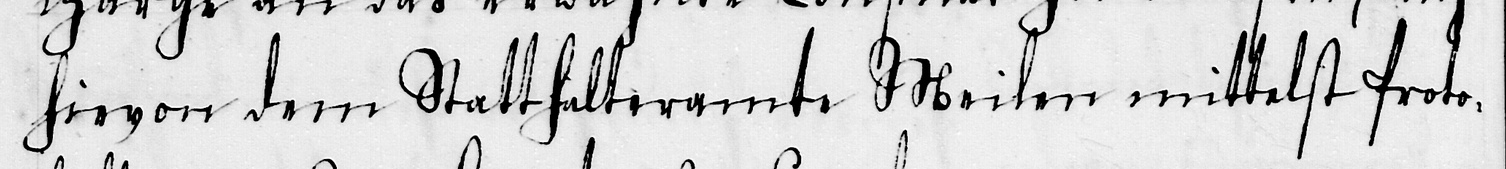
hievon dem Statthalteramte Meilen mittelst Proto¬
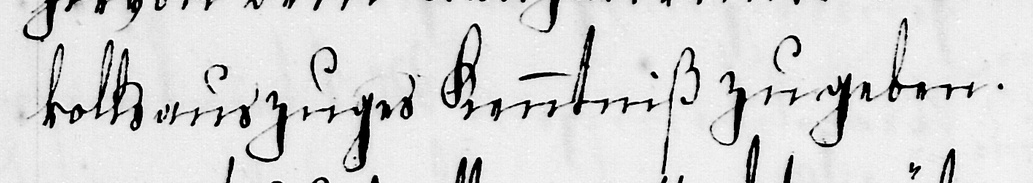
kollsauszuges Kenntniß zu geben.
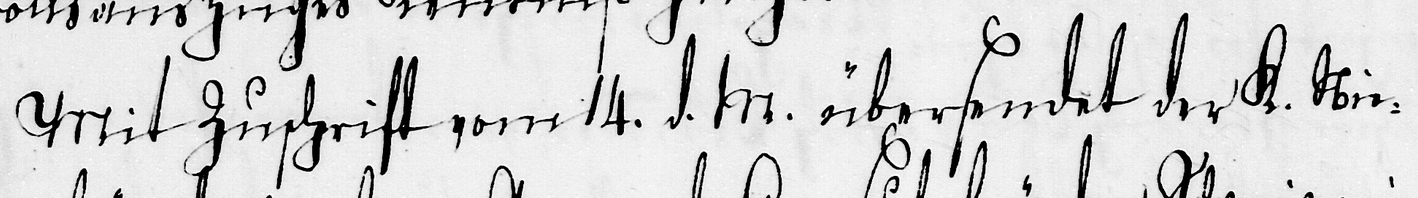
Mit Zuschrift vom 14. d. M. übersendet der K. Nie¬
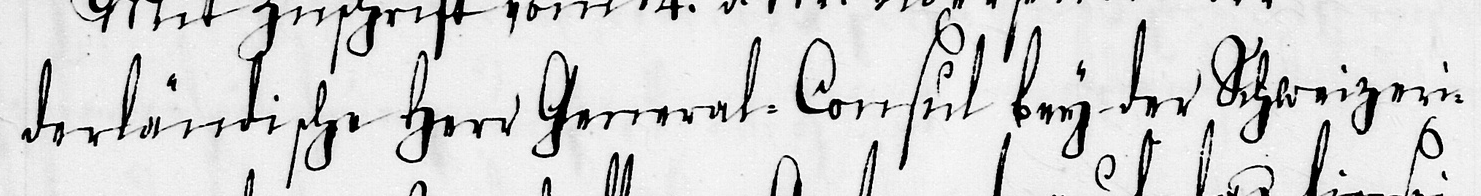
derländische Herr General-Consul bey der Schweizeri¬
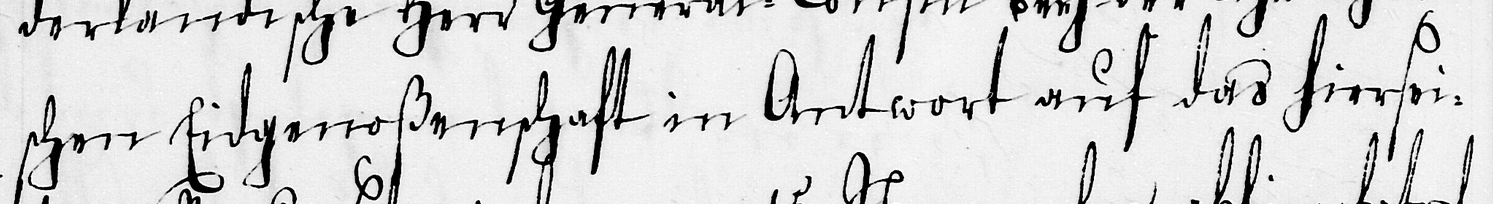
schen Eidgenoßenschaft in Antwort auf das hiersei¬
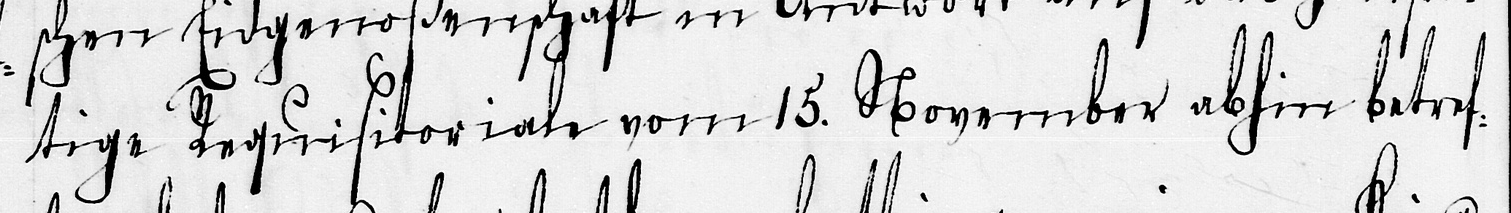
tige Requisitorische vom 15. November abhin betref¬
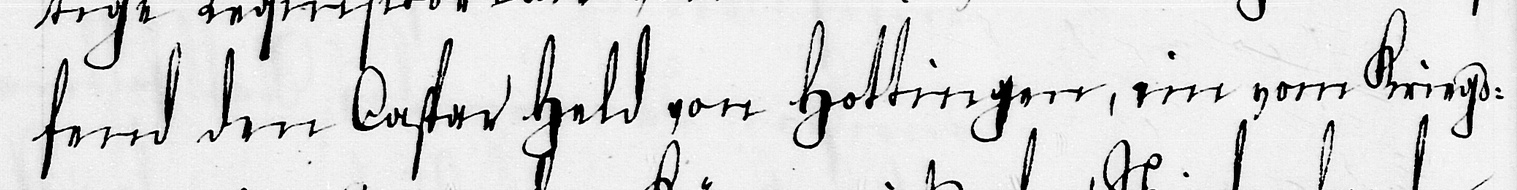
fend den Caspar Held von Hottingen, ein vom Kriegs¬
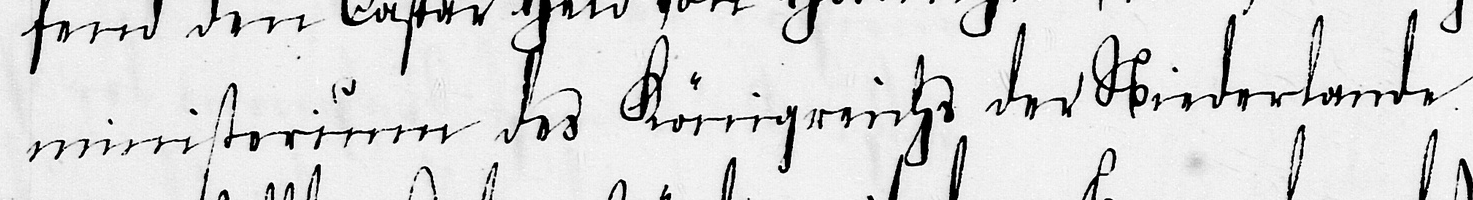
ministerium des Königreichs der Niederlande
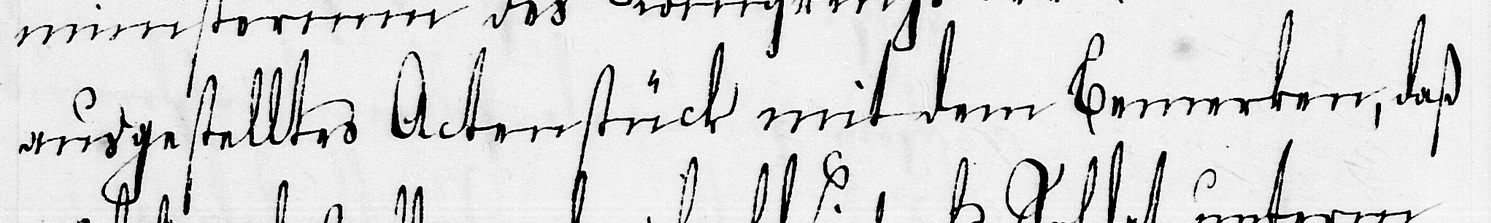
ausgestelltes Actenstück mit dem Bemerken, daß
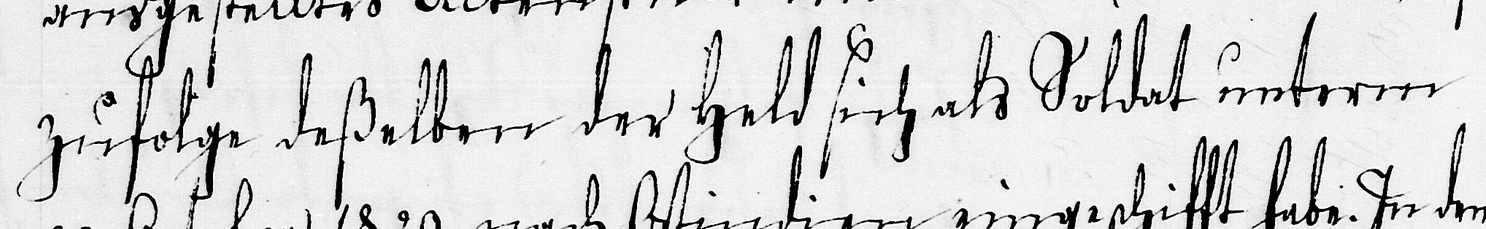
zufolge deßelben der Held sich als Soldat unterm
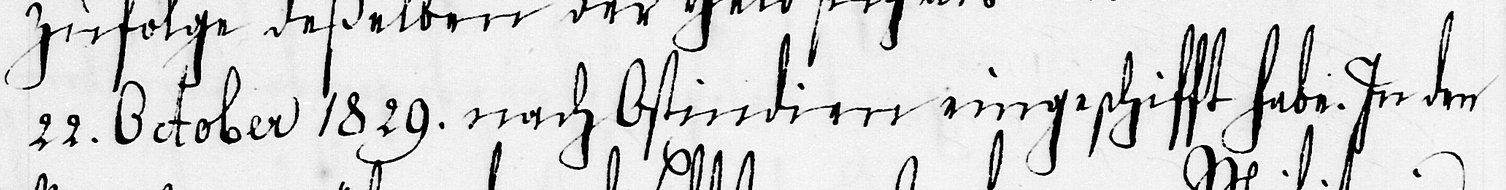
22. October 1829. nach Ostindien eingeschifft habe. In den
